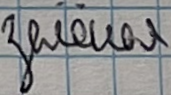зелёная
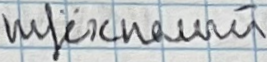трёхпалый
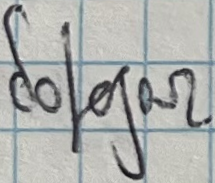бородач
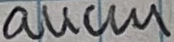аист
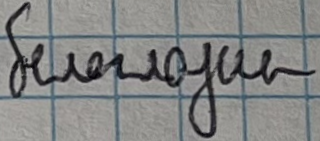белоглазка
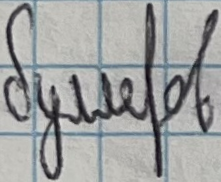буллеров
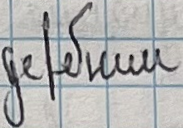дербник
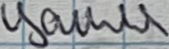цапля
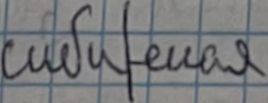сибирская
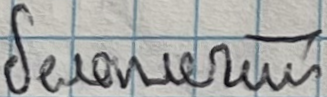белоплечий
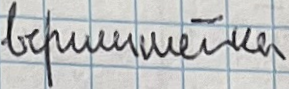вертишейка
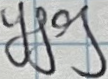удод
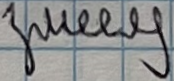змееяд
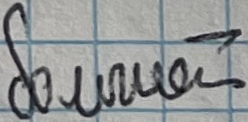большой
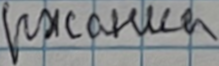ржанка
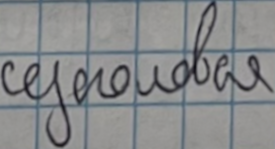седоголовая
